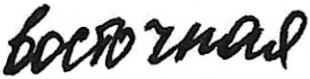восточная
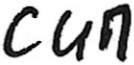сип
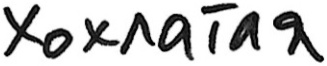хохлатая
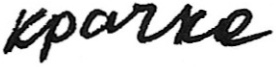крачка
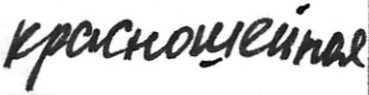красношейная
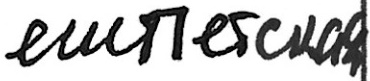египетская
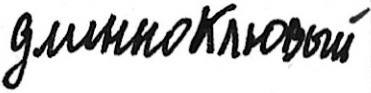длинноклювый
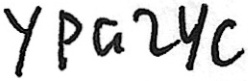урагус
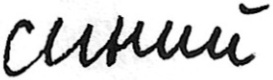синий
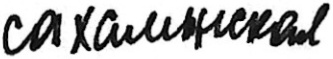сахалинская
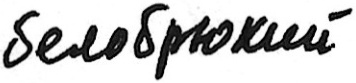белобрюхий
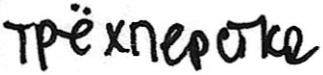трёхперстка
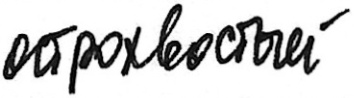острохвостый
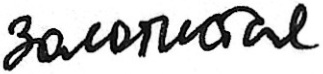золотистая
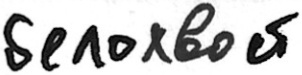белохвост
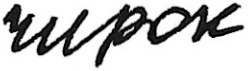чирок
